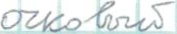очковый
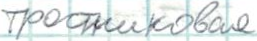тростниковая
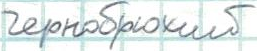чернобрюхий
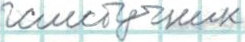галстучник
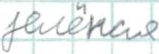зелёная
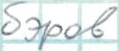бэров
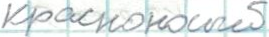красноносый
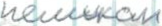пеликан
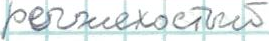рыжехостый
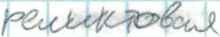реликтовая
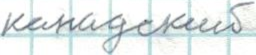канадский
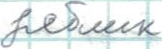зяблик
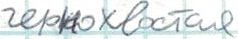чернохвостая
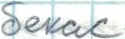бекас
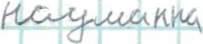науманна
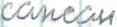сапсан
